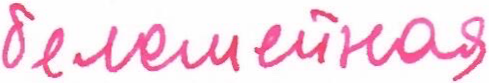белошейная
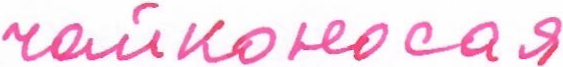чайконосая
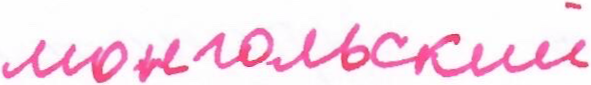монгольский
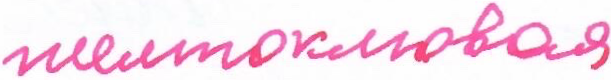желтоклювая
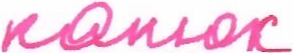канюк
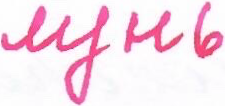лунь
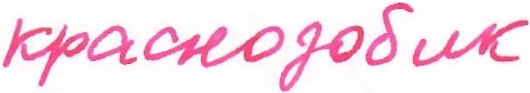краснозобик
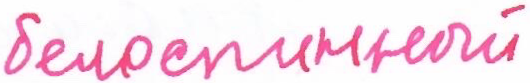белоспинный
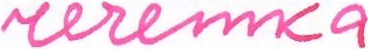чечетка
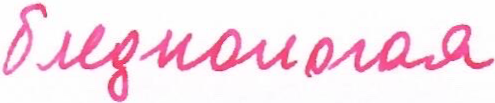бледноногая
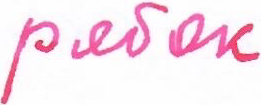рябок
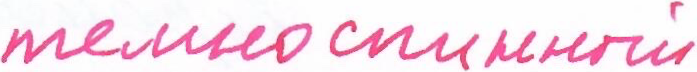темноспинный
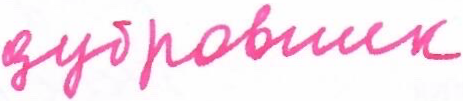дубровник
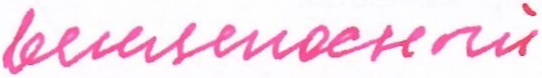венценосный
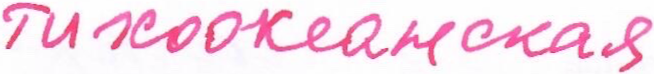тихоокеанская
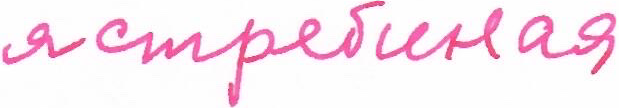ястребиная
